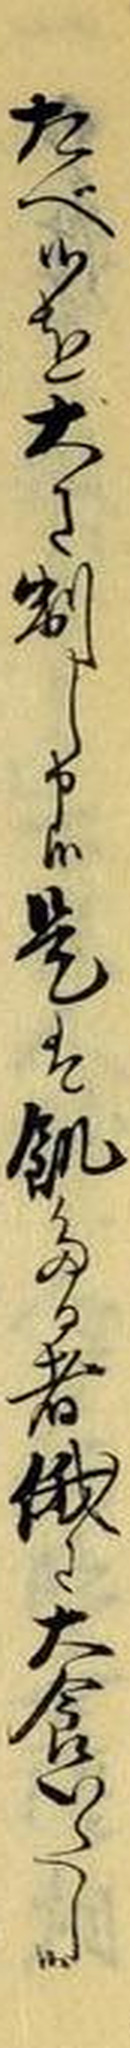たべ候を大に制し申候是は飢たる者俄に大食いたし候
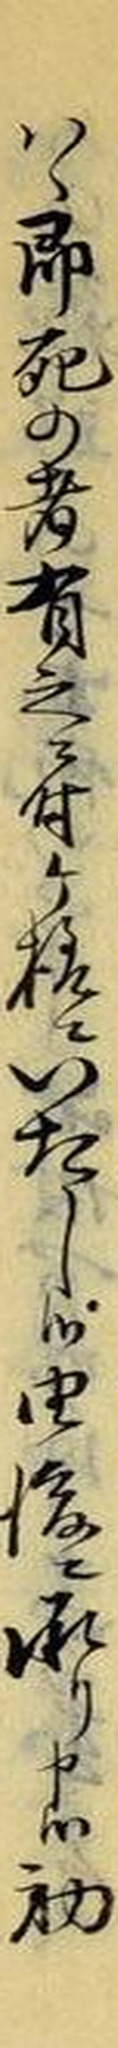ハヽ即死の者有之ニ付ケ様ニいたし候由後ニ承り申候初
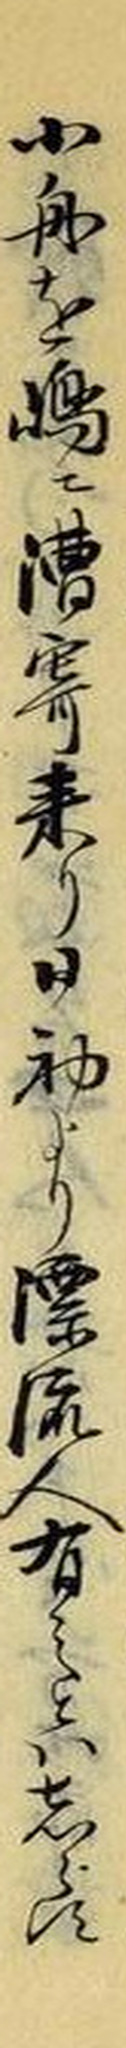小舟を嶋ニ漕寄来り日初より漂流人有之とハしらす
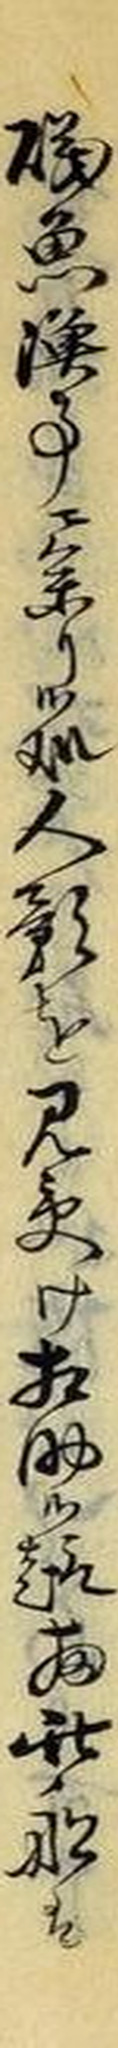磯魚漁事ニ参り候処人影を見受け相助候趣扨此船は
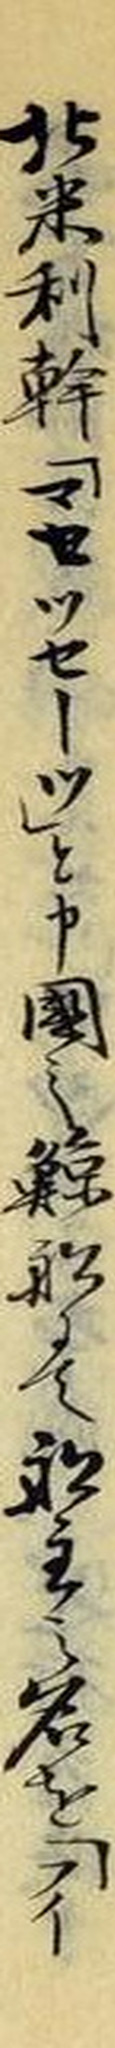北米利幹「マサツセーツ」と申国之鯨船にて船主之名を「フイ
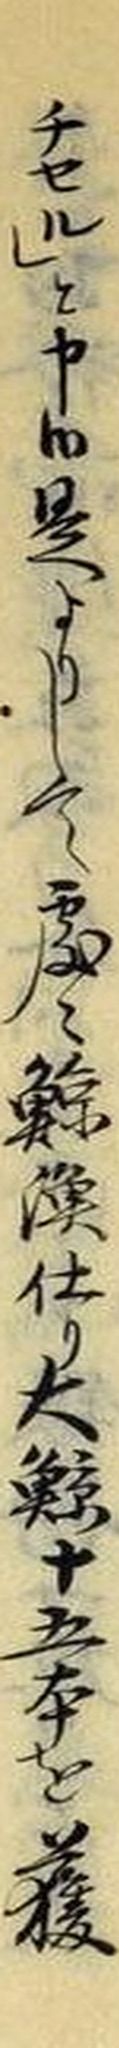チセル」と申候是よりして処々鯨漁仕り大鯨十五本を獲
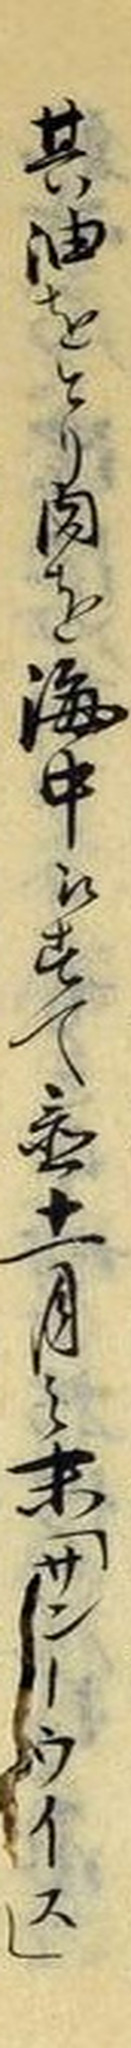其油をとり肉を海中江すて置十一月之末「サンーウイス」
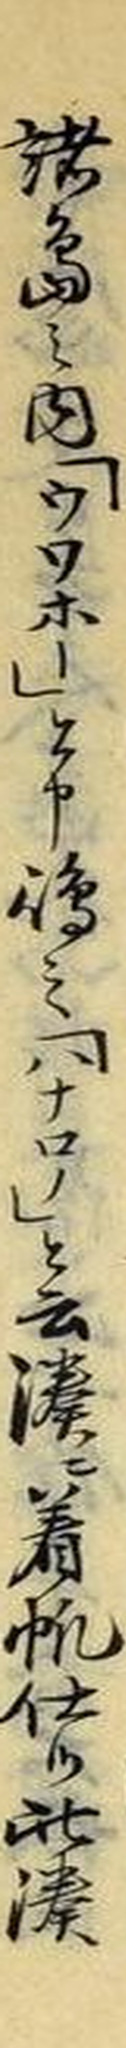諸島之内「ウワホー」と申嶋之「ハナロノ」と云湊ニ着帆仕候此湊
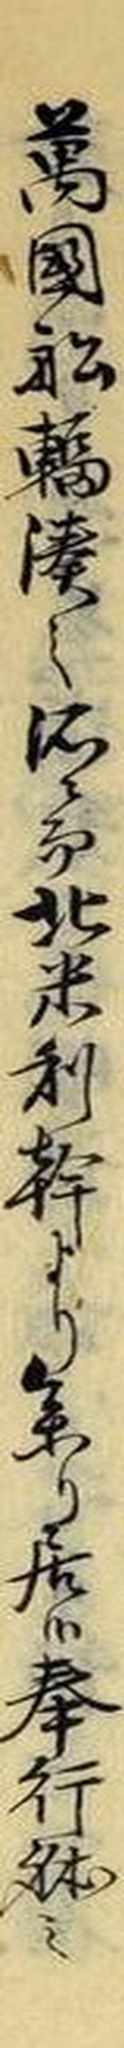万国船輻湊之所ニ而北米利幹より参り居候奉行体之
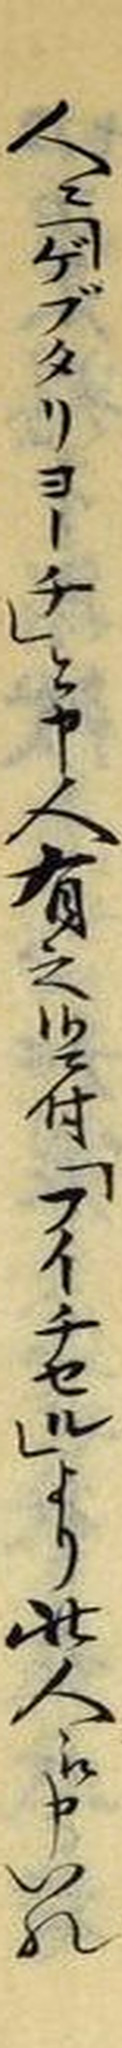人ニ「ゲブタリヨーチ」と申人有之候ニ付「フイチセル」より此人江申いれ、
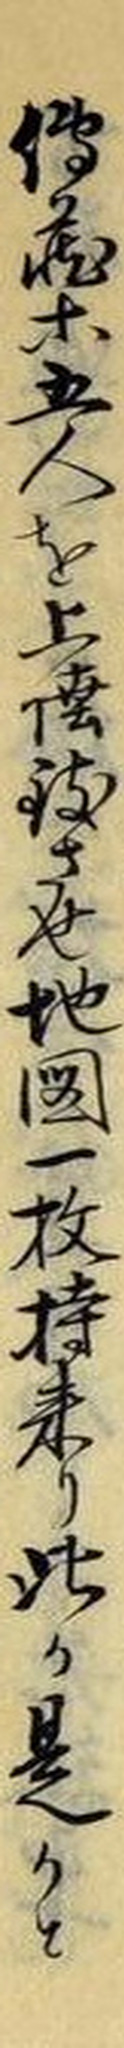伝蔵等五人を上陸致させ地図一枚持来り此か是かと
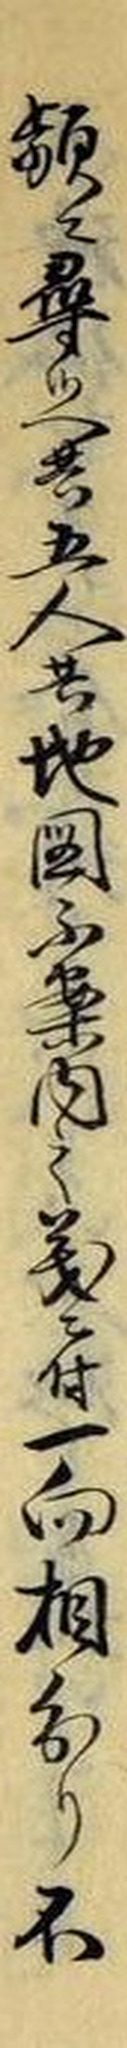頻ニ尋候へ共五人共地図不案内之義ニ付一向相分り不

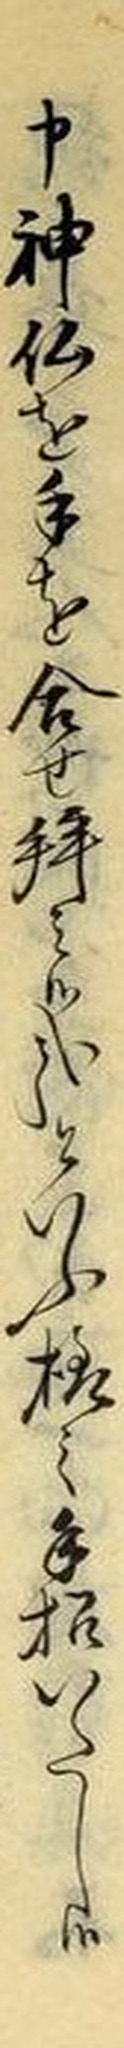申神仏を手を合せ拝ミ候哉といふ様之手招いたし候
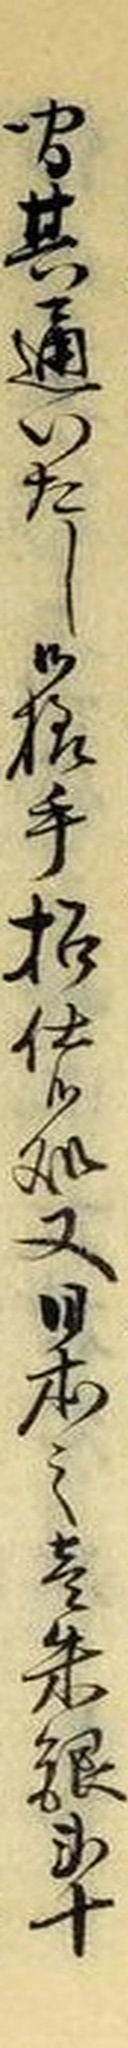間其通いたし候様手招仕候処又日本之壱朱銀弐十
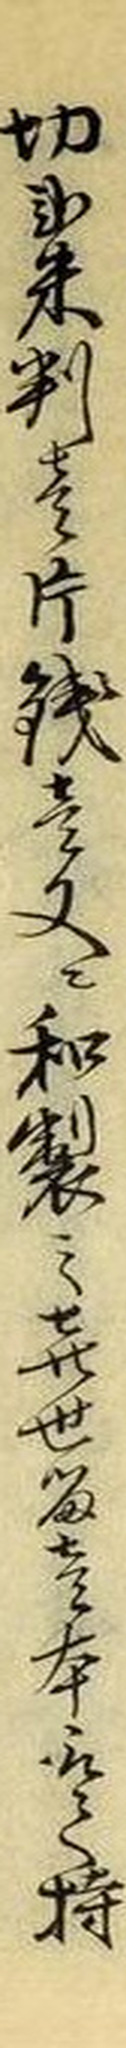切弐朱判壱片銭一文ニ和製之きせる壱本取て持
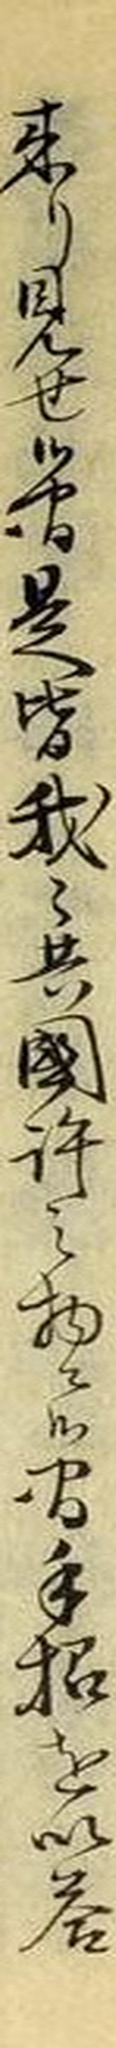来り見せ候間是皆我々共国許之物ニ候間手招を以答
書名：漂客談奇（備考雑録写8）
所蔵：福井県文書館 Fukui Prefectural Archives
